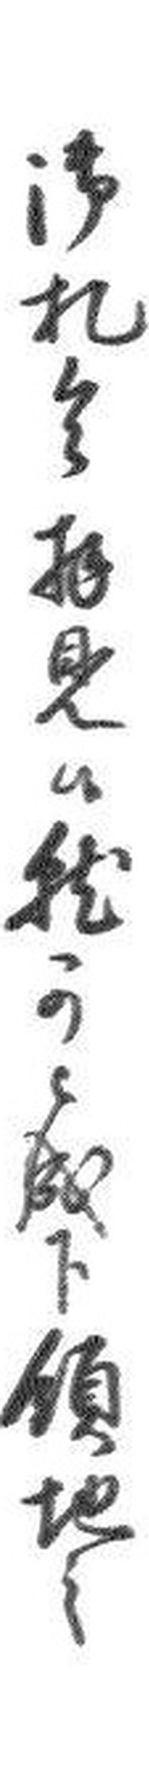御札令拝見候就可被成下領地之
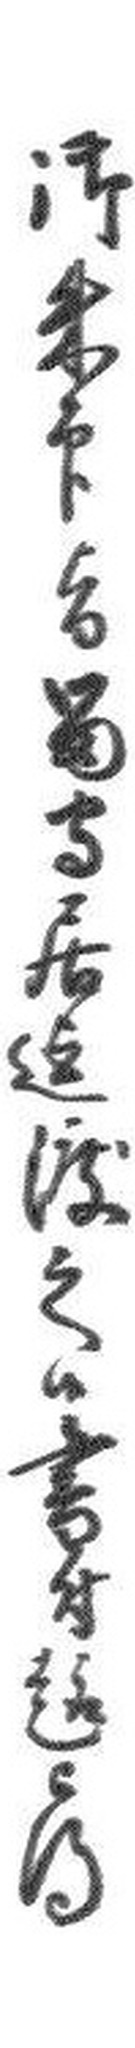御朱印旨留守居迄渡之候書付趣被得
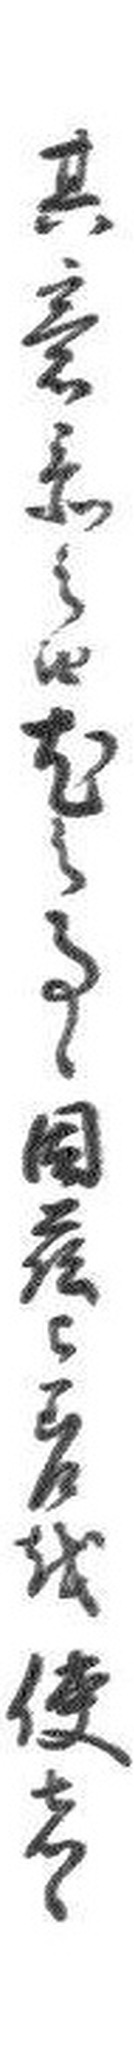其意忝之由尤之事侯因茲被差越使者ヘ
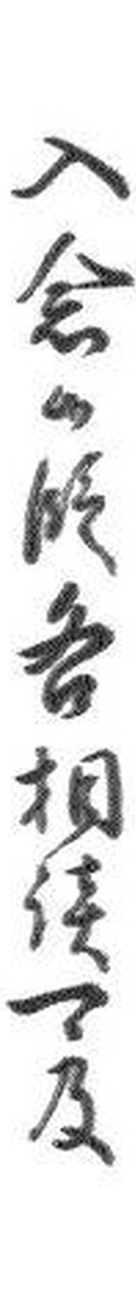入念候段各相談可及
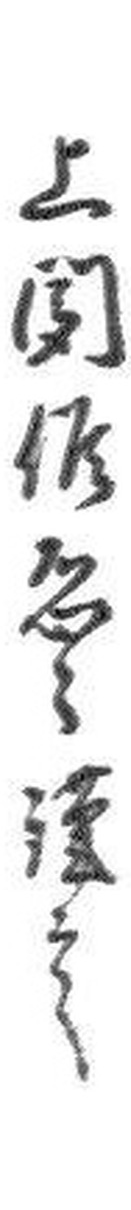上聞候恐々謹言

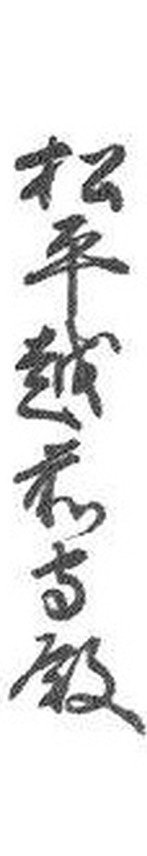松平越前守殿
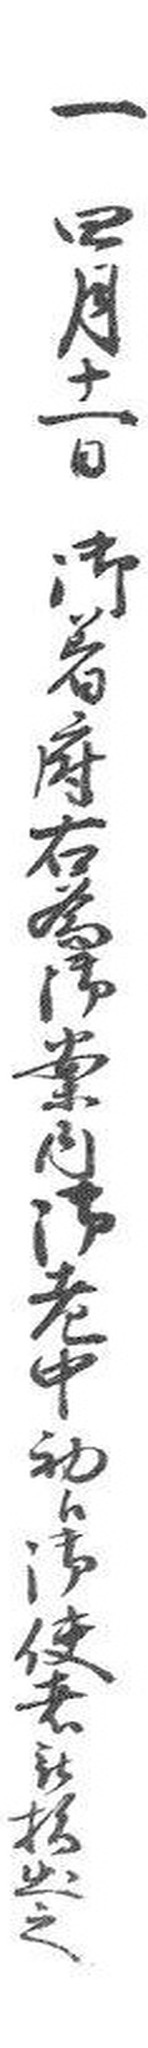一四月十一日御着府右為御案内御老中初江御使者被指出之
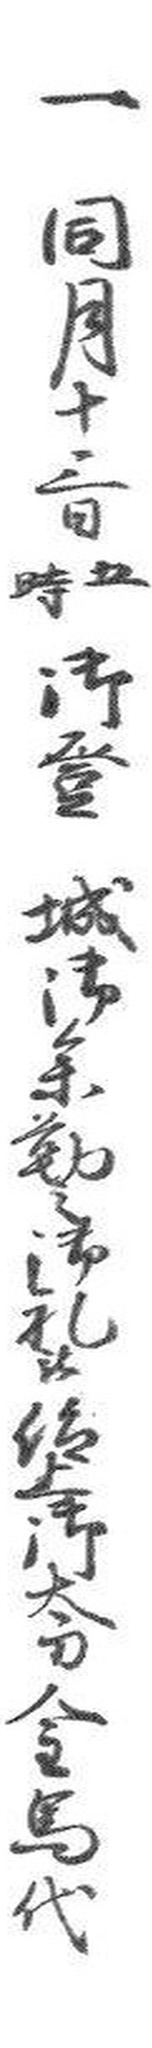一同月十三日五時御登城御参勤之御礼被仰上御太刀金馬代
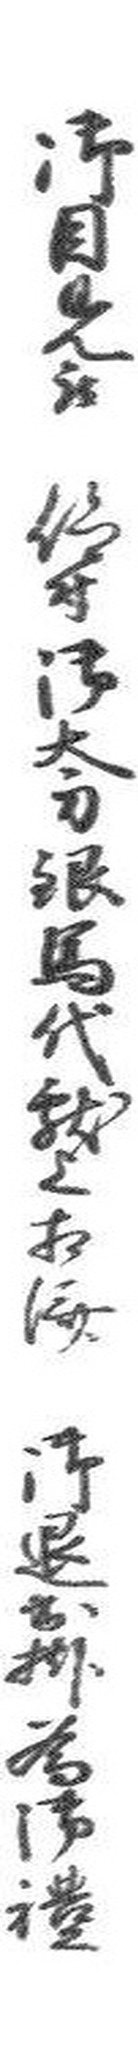御目見被仰付御太刀銀馬代献上相済御退出掛為御礼
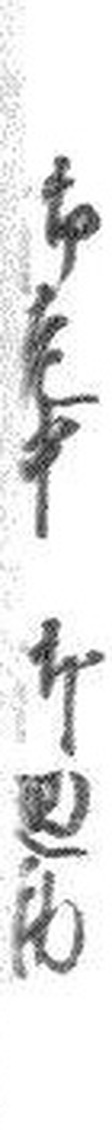御老中御回勤
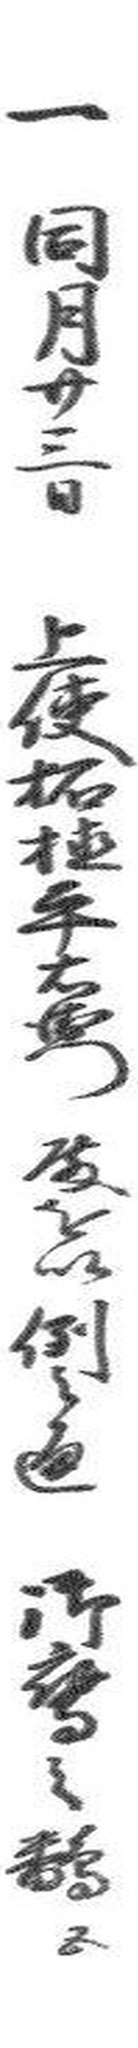一同月廿三日上使柘植平右衛門殿を以例之通御鷹之鷭五
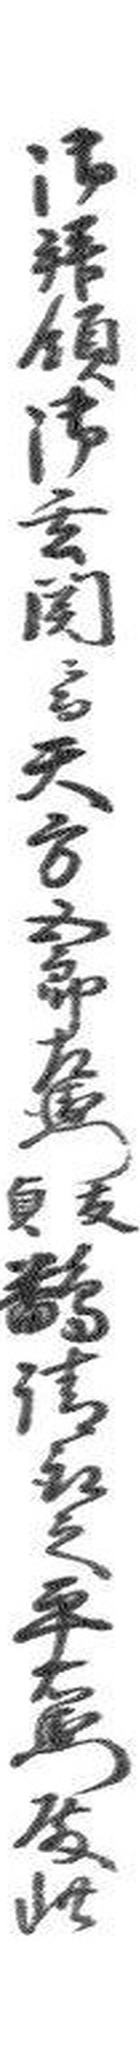御拝領御玄関ニ而天方五郎右衛門友貞鷭請取之平右衛門殿此
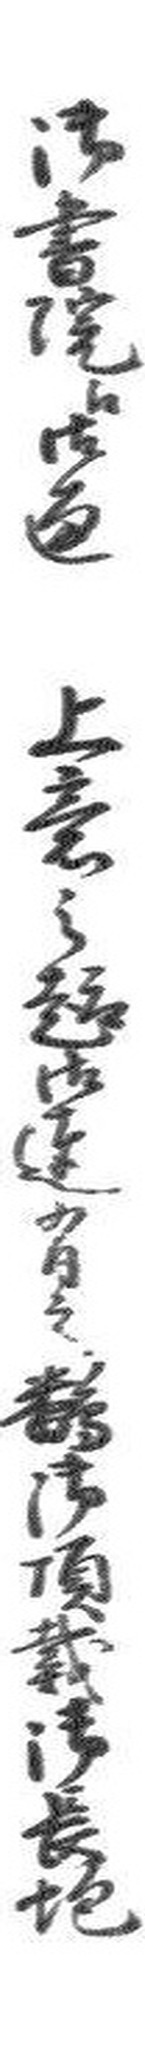御書院江御通上意之趣御達有之鷭御頂戴御長蚫
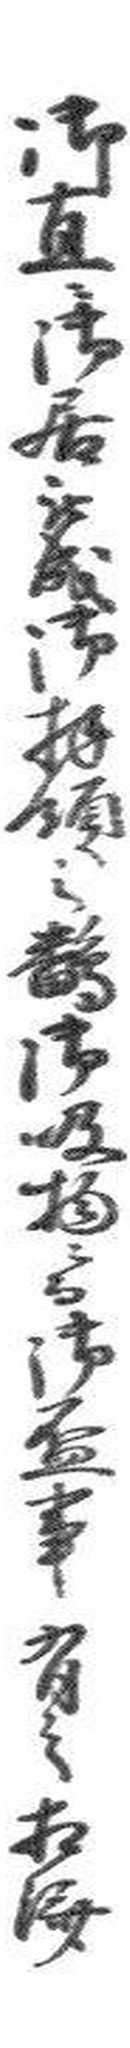御直ニ御居被成御拝領之鷭御吸物ニ而御盃事有之相済
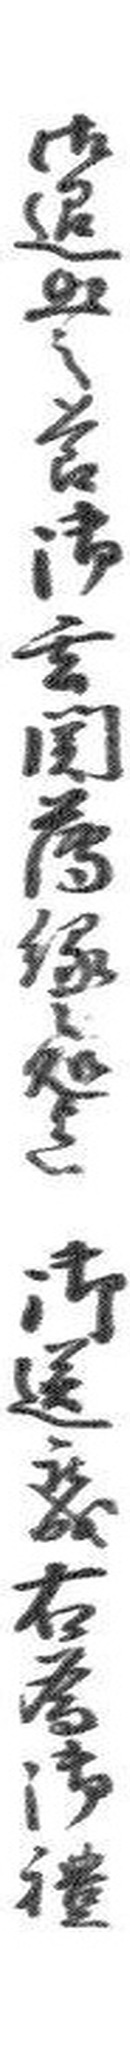御退出之節御玄関薄縁之処迄御送被成為右御礼
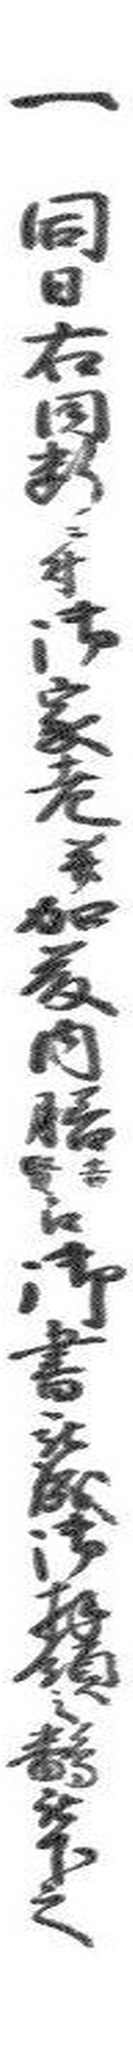一同日右同断ニ付御家老并加藤内膳吉賢江御書被成御拝領之鷭被
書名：家譜 七 光通公 従寛文四年到同九年
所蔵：福井県文書館 Fukui Prefectural Archives
